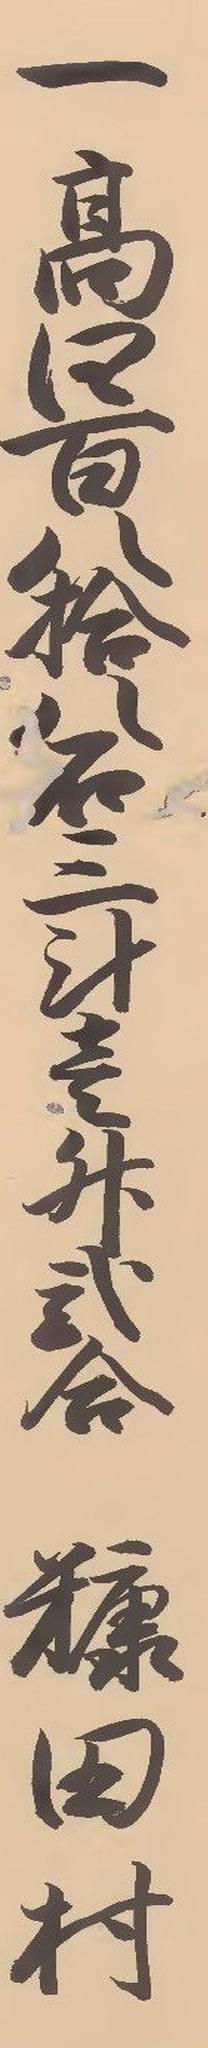一高四百八拾八石三斗壱升弐合糠田村
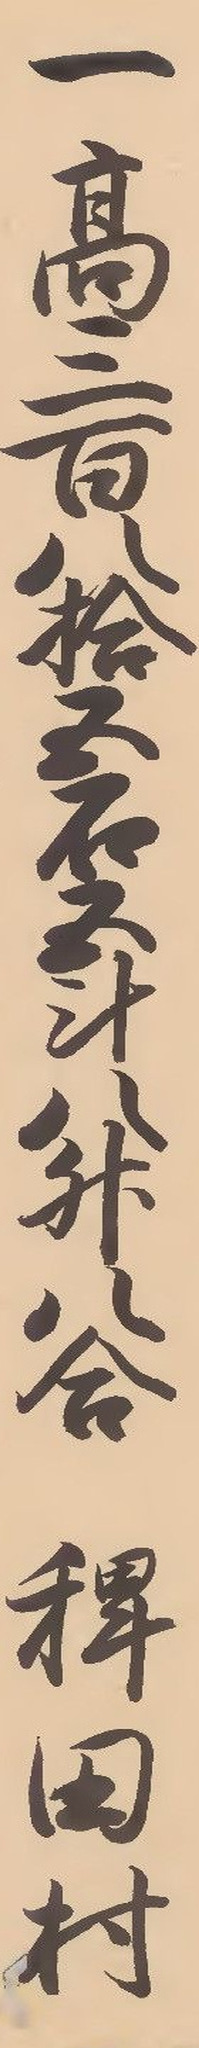一高三百八拾五石五斗八升八合稗田村
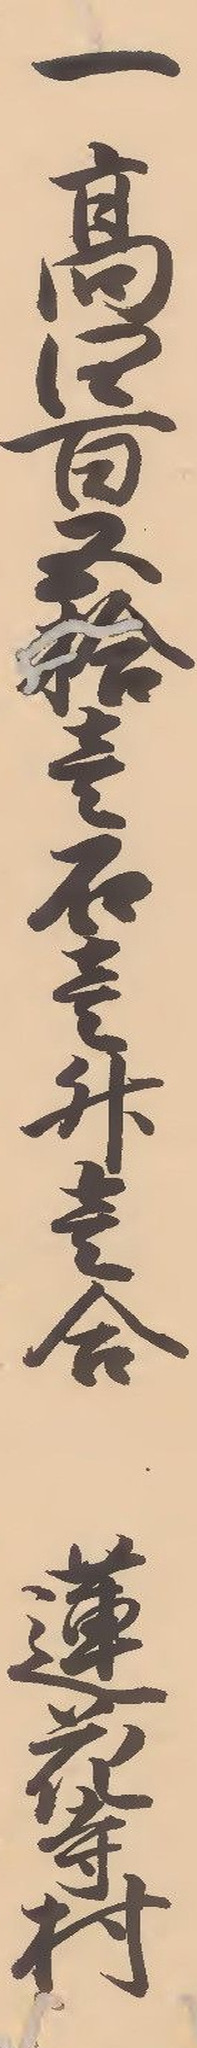一高四百五拾壱石壱升壱合蓮華寺村

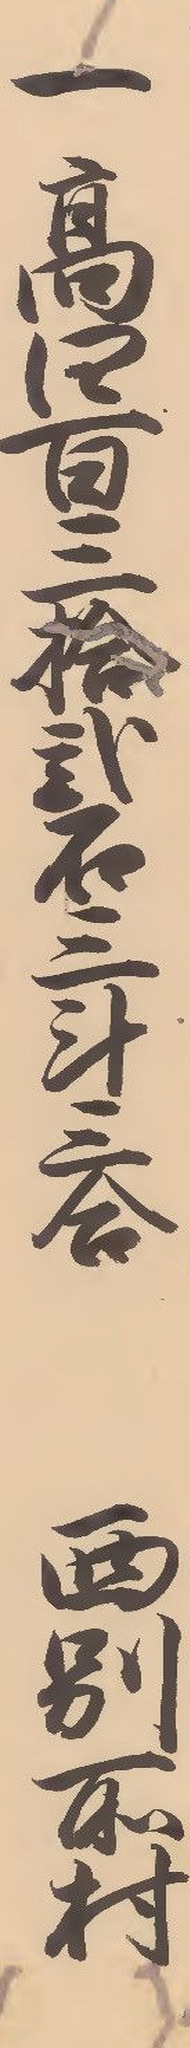一高四百三拾弐石三斗三合西別所村
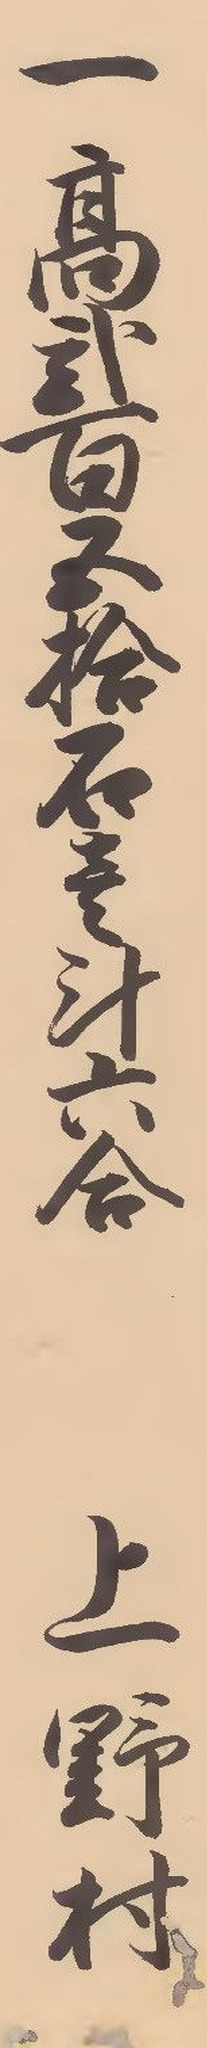一高弐白五拾石壱斗六合上野村
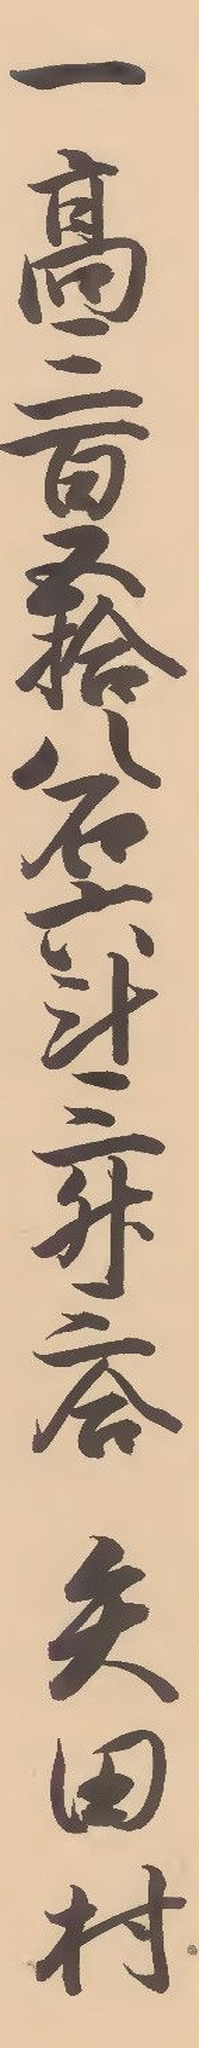一高三百五拾八石六斗三升三合矢田村
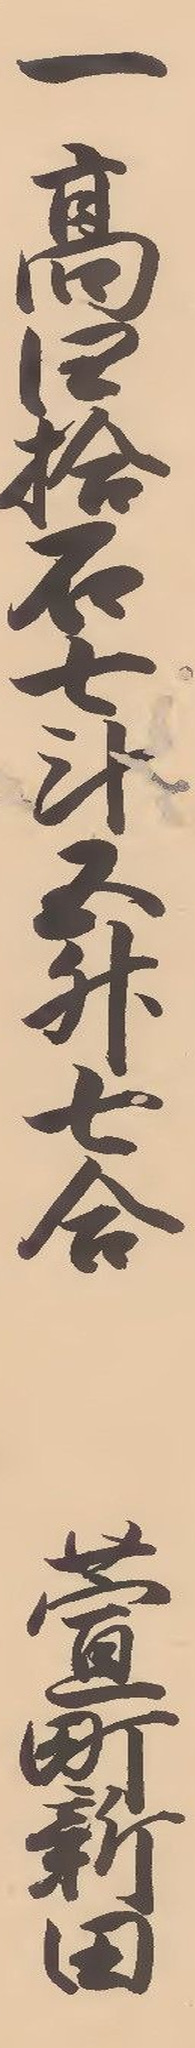一高四拾石七斗五升七合萱町新田
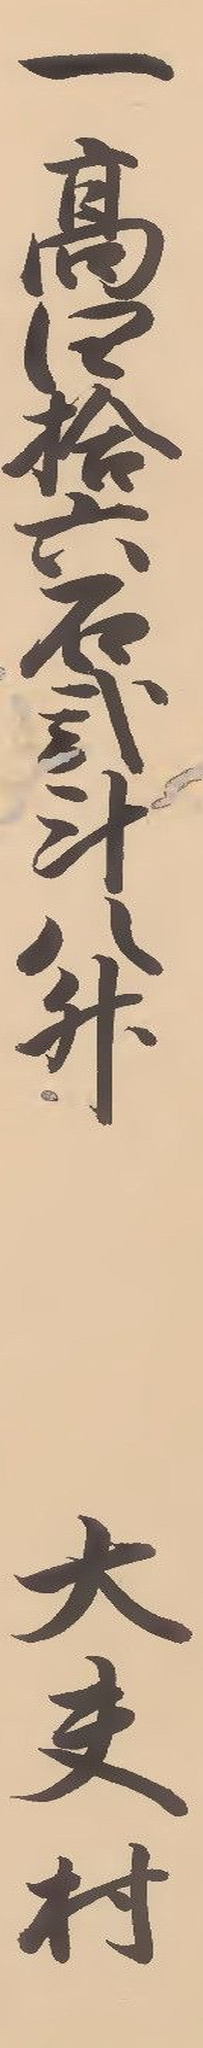一高四拾六石弐斗八升大夫村
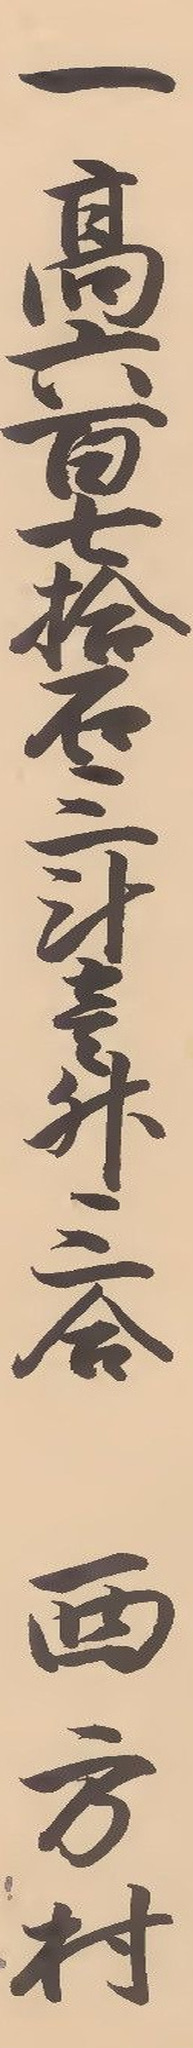一高六百七拾石三斗壱升三合西方村
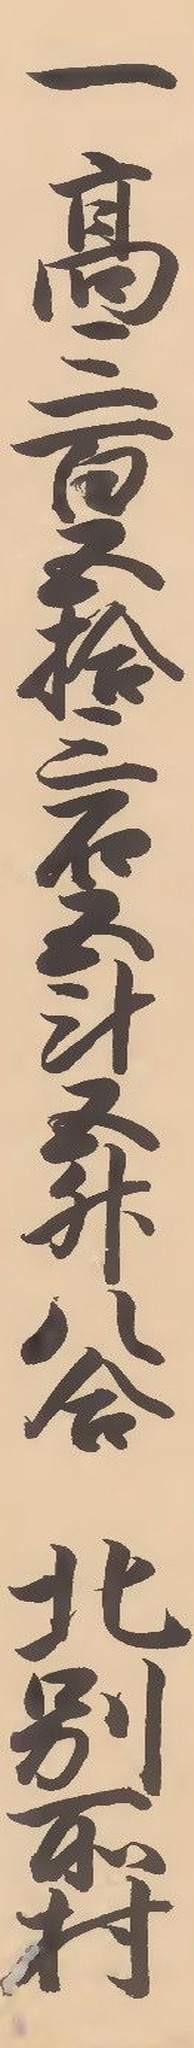一高三百五拾三石五斗五升八合北別所村

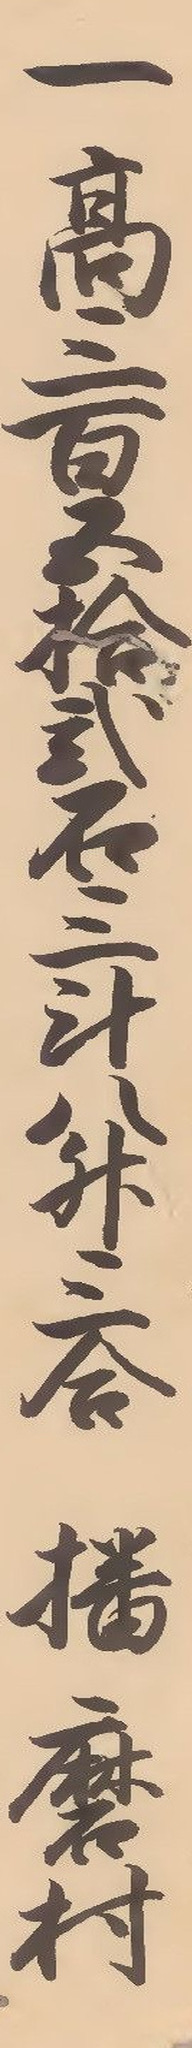一高三百五拾弐石三斗八升三合播磨村
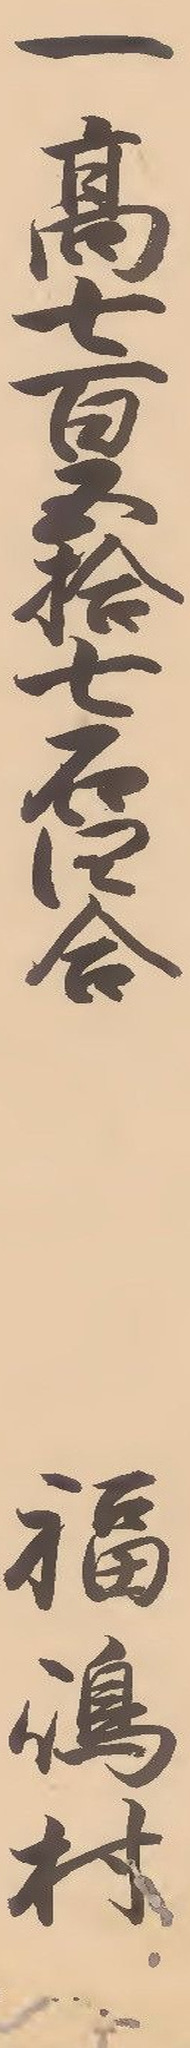一高七百五拾七石四合福嶋村
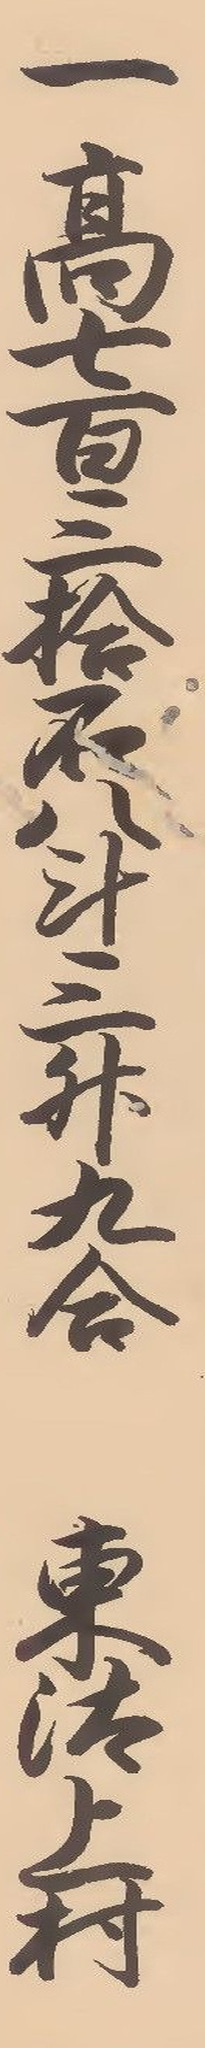一高七百三拾石八斗三升九合東汰上村
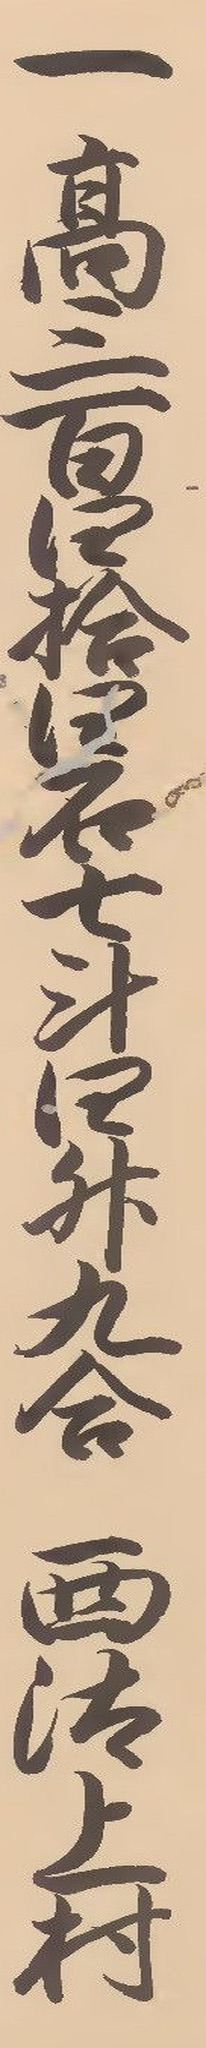一高三百四拾四石七斗四升九合西汰上村
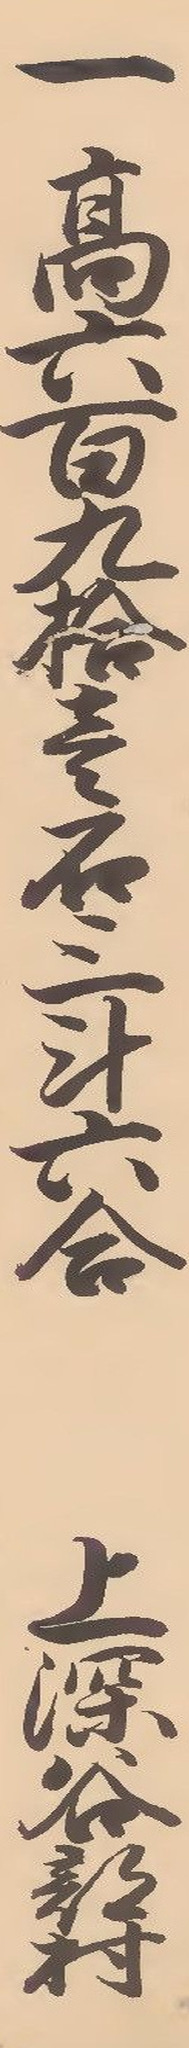一高六百九拾壱石三斗六合上深谷部村

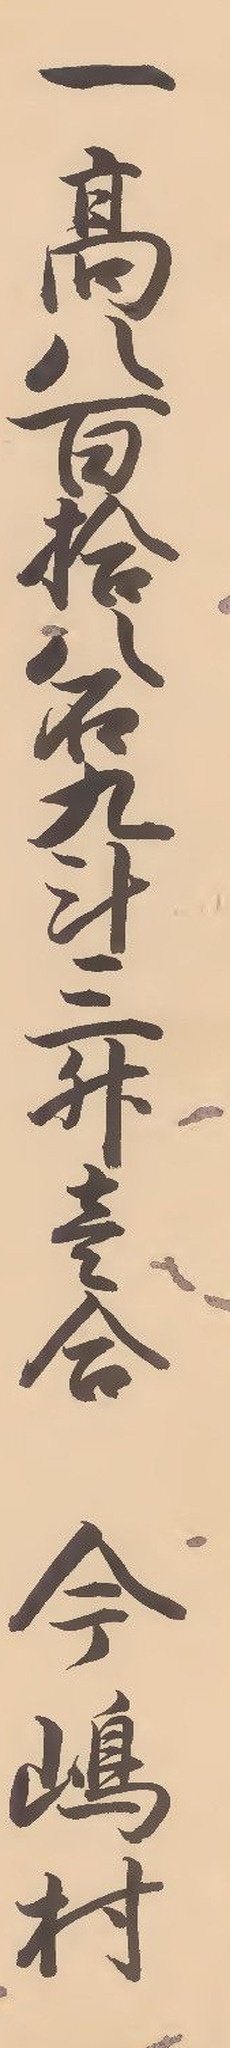一高八百拾八石九斗三升壱合今嶋村
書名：伊勢国郷帳
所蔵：国立公文書館 National Archives of Japan
